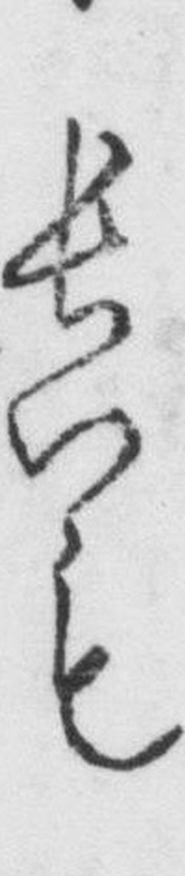長いも
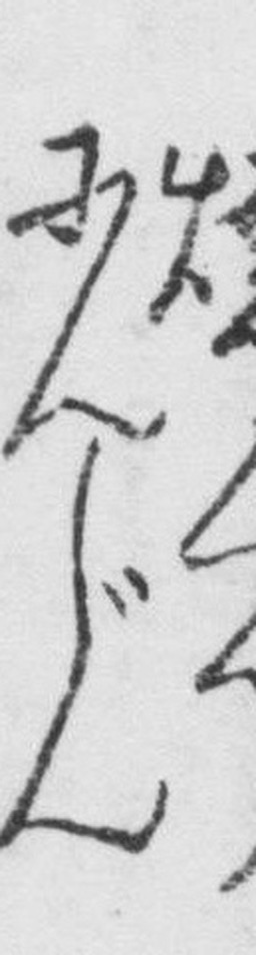尓んじん
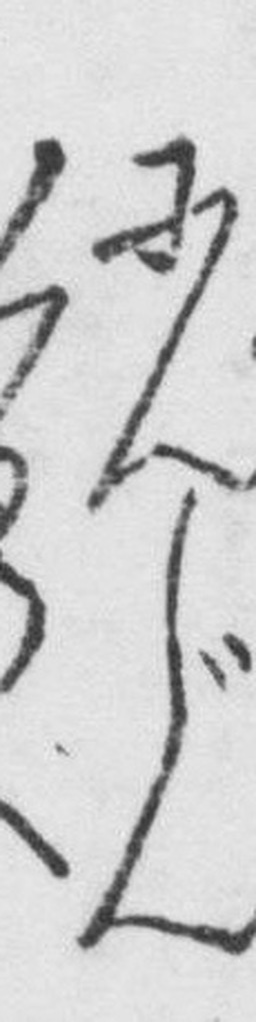くわへ
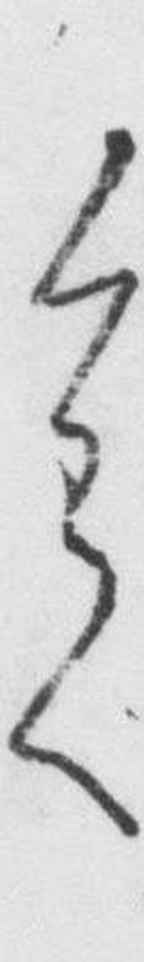くわへ

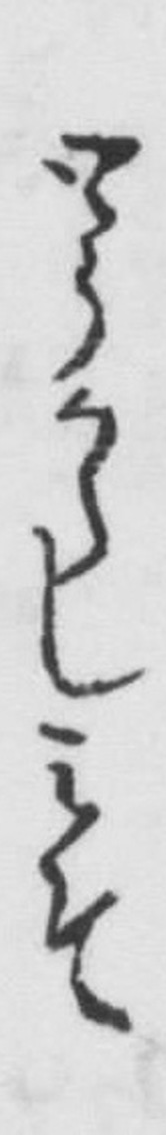とうからしみそ
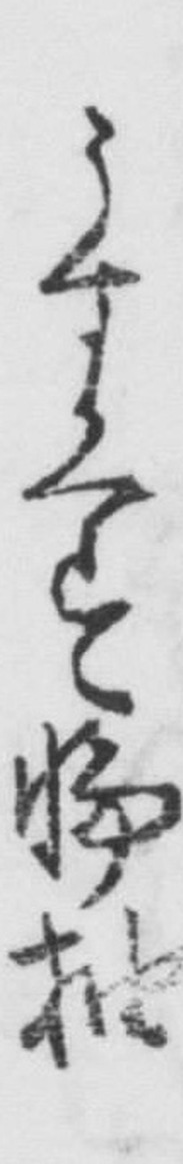うすく春輪柚
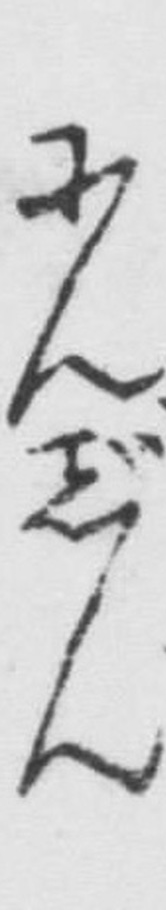尓んじん
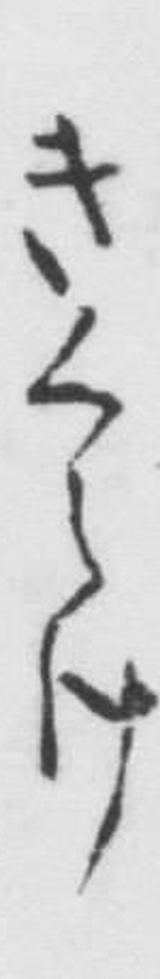きくらけ
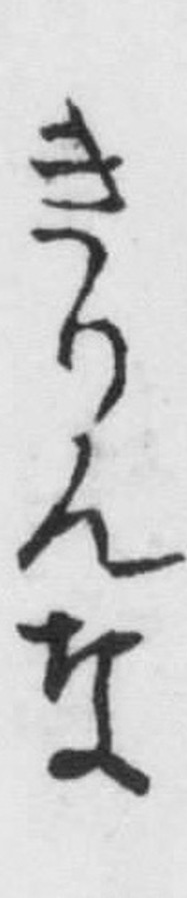きりんな
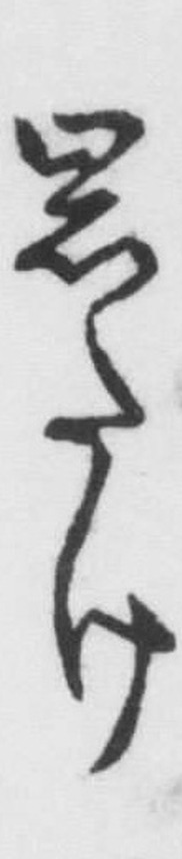黒たけ
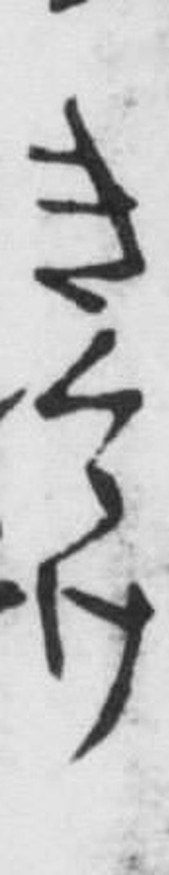きくらけ
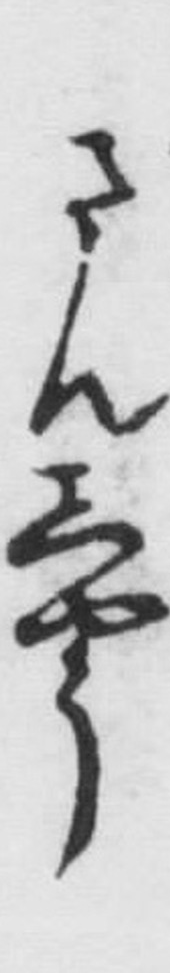さん志やう

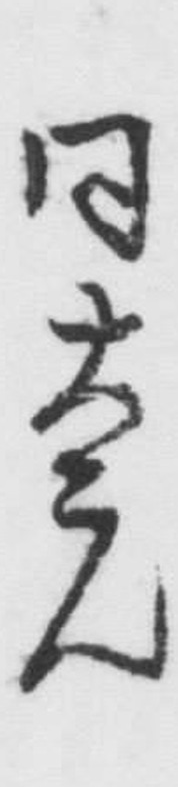同大こん
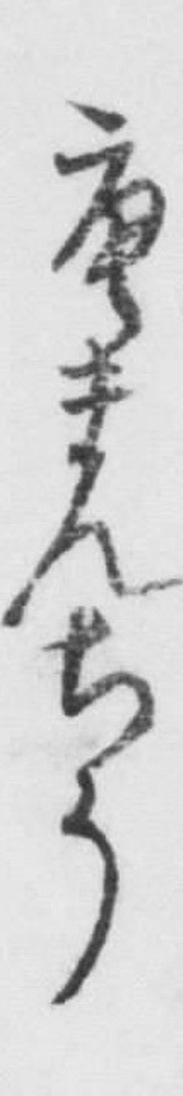唐まんちう
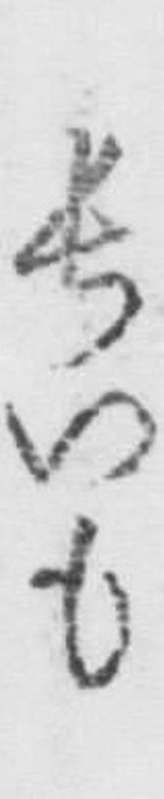長いも

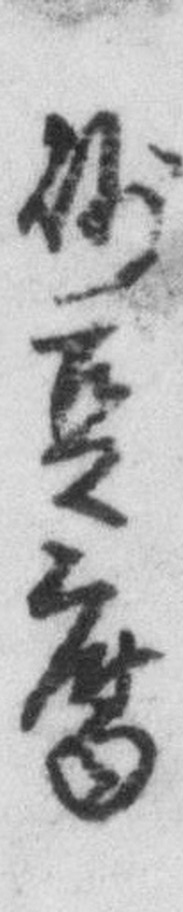砂豆腐
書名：普茶料理抄
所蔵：大阪府立大学学術情報センター 国文学研究資料館
